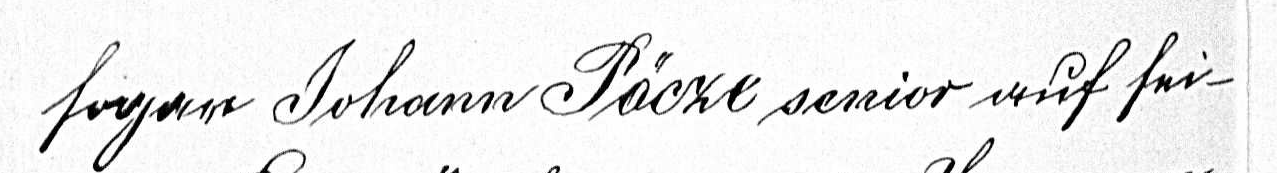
sogar Johann Pöcze senior auf sei¬
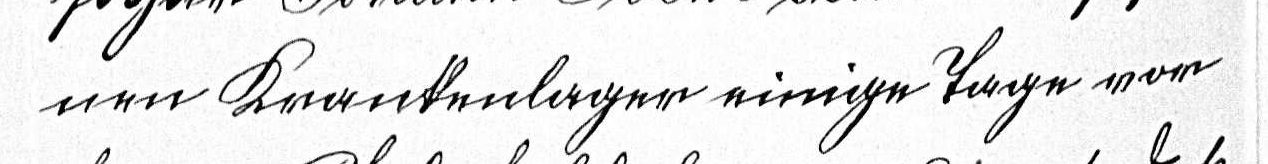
nen Krankenlager einige Tage vor
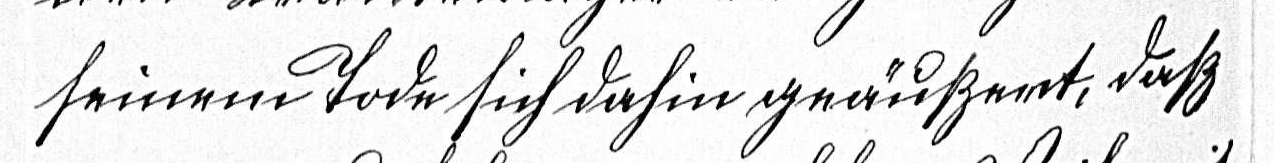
seinem Tode sich dahin geäußert, daß
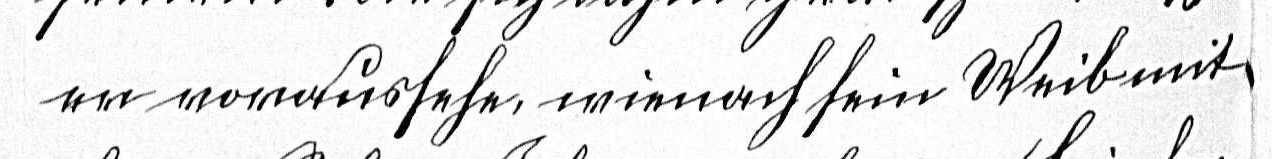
er voraussehe, wienach sein Weib mit
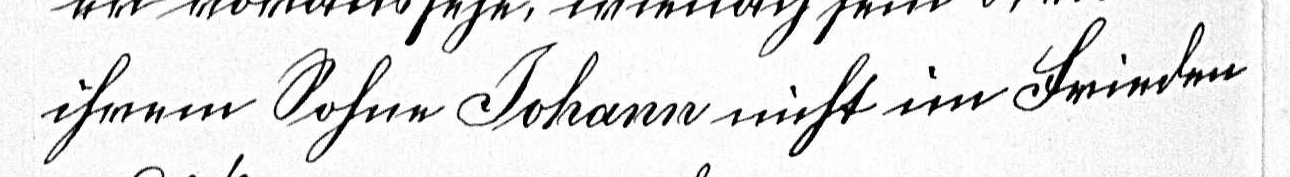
ihrem Sohne Johann nicht im Frieden
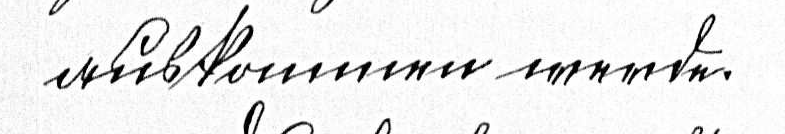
auskommen werde.
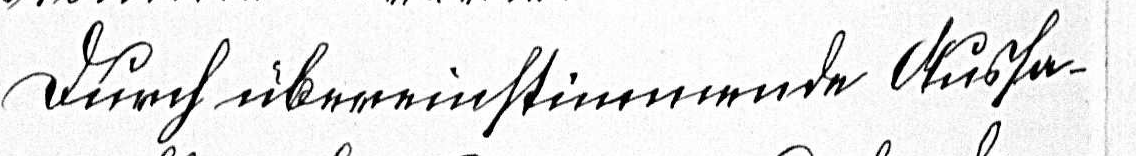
Durch übereinstimmende Aussa¬
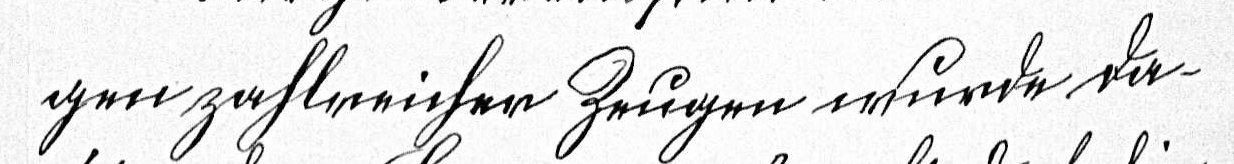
gen zahlreicher Zeugen wurde da¬
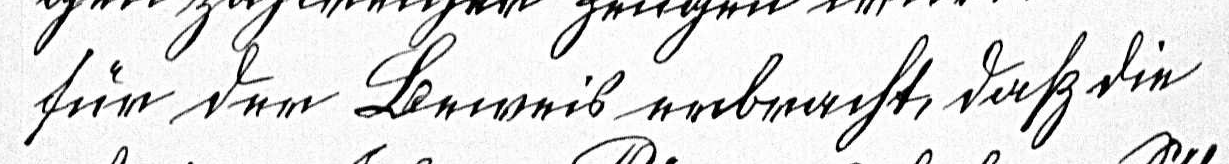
für der Beweis erbracht, daß die
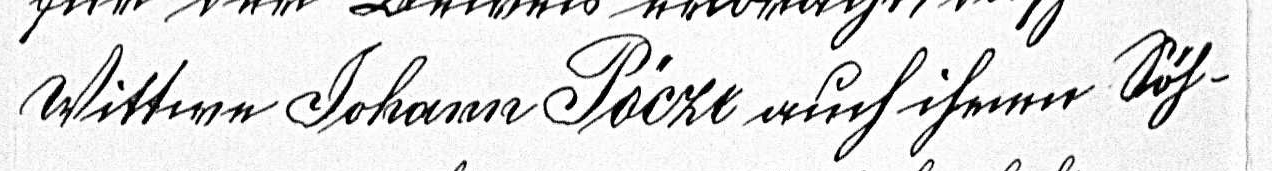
Wittwe Johann Pöcze auch ihren Söh¬
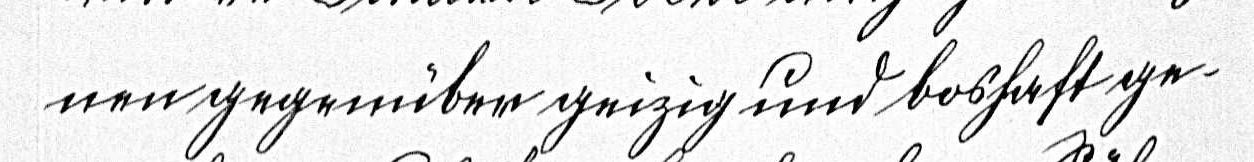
nen gegenüber geizig und boshaft ge¬
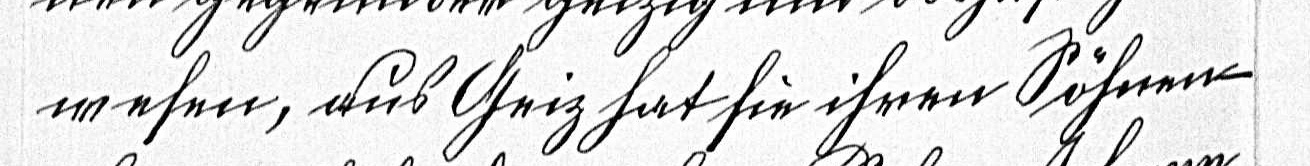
wesen, aus Geiz hat sie ihren Söhnen
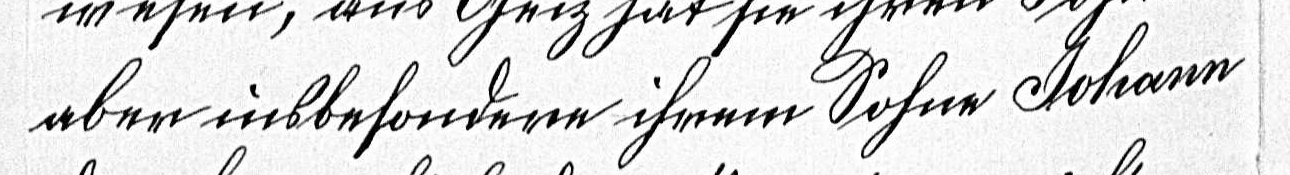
aber insbesondere ihrem Sohne Johann
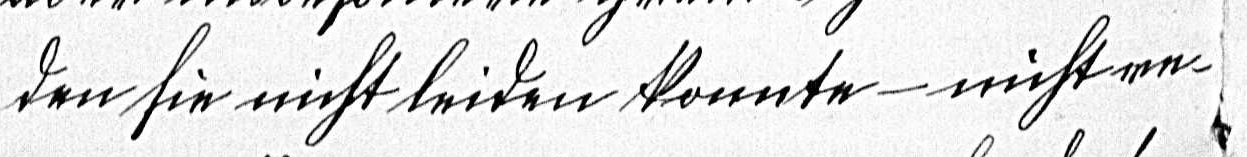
den sie nicht leiden konnte – nicht re¬
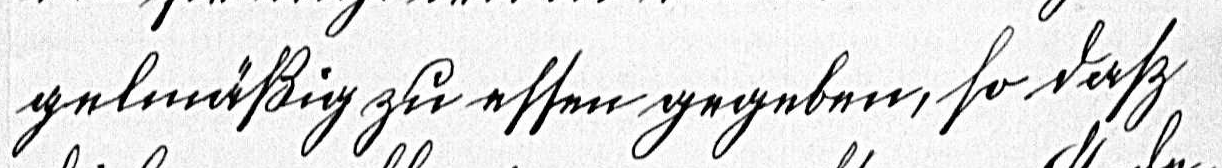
gelmäßig zu essen gegeben, so daß
